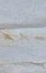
Lieber
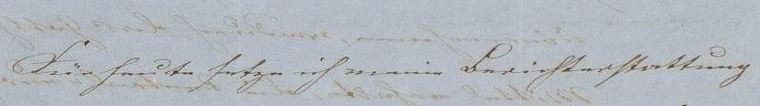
Für heute setze ich meine Berichterstattung
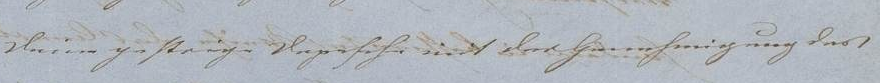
Deine gestrige Depesche mit der Genehmigung des
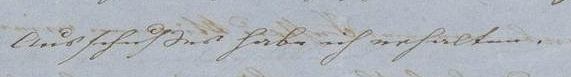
Ausschußes habe ich erhalten.
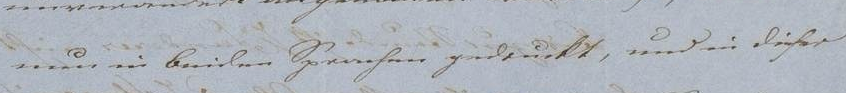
nun in beiden Sprachen gedruckt, und in dieser
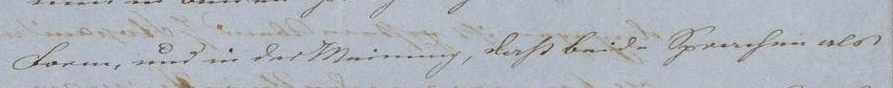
Form, und in der Meinung, daß beide Sprachen als
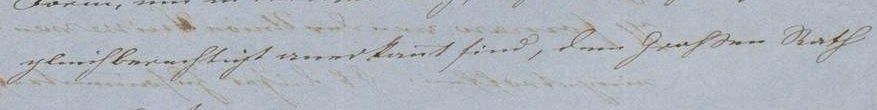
gleichberechtigt anerkannt sind, dem Großen Rath
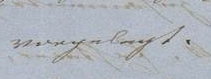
vorgelegt.
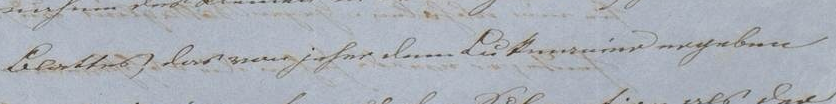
Blattes, das von jeher dem Lukmanier ergeben
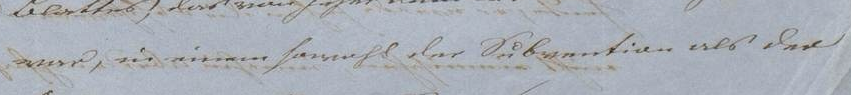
war, in einem sowohl der Subvention als der
